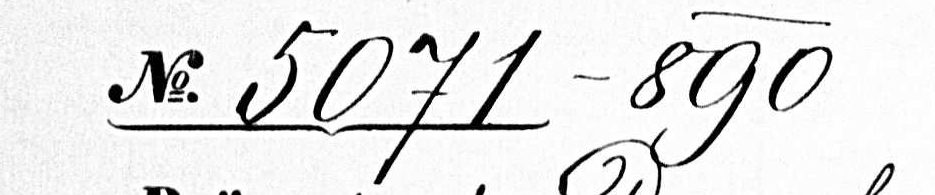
No. 5071 - 890
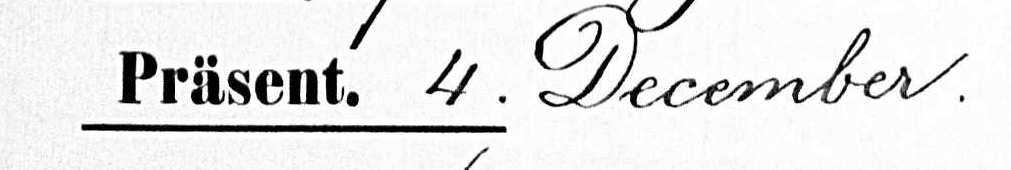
Präsent. 4. December.
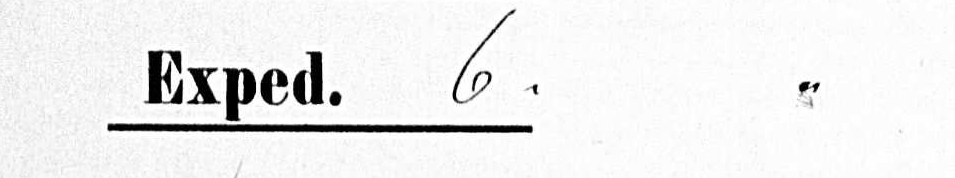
Exped. 6. December.
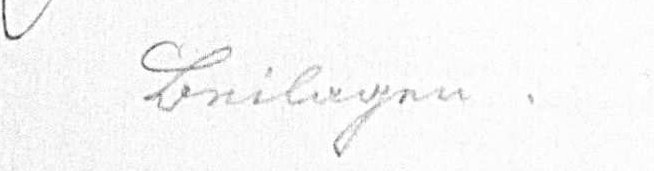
Beilagen.
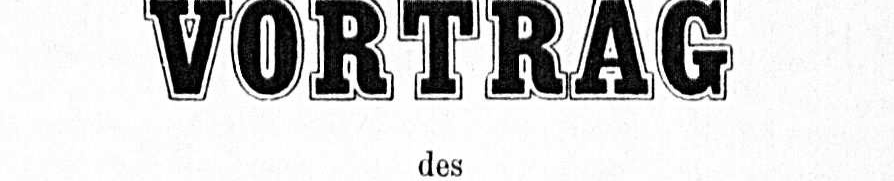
Vortrag
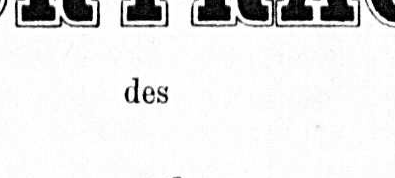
des
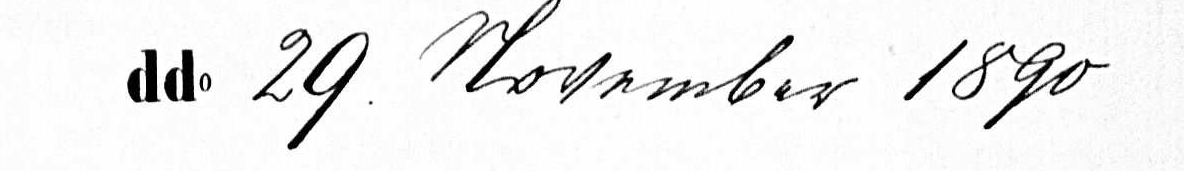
ddo 29. November 1890
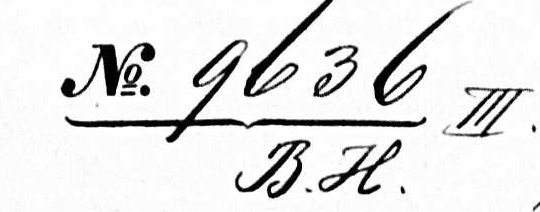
No. 9636 III.
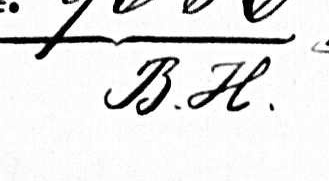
B. H.
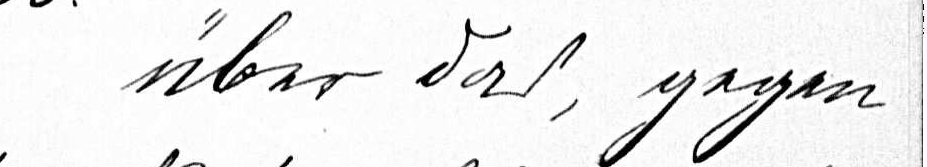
über das, gegen
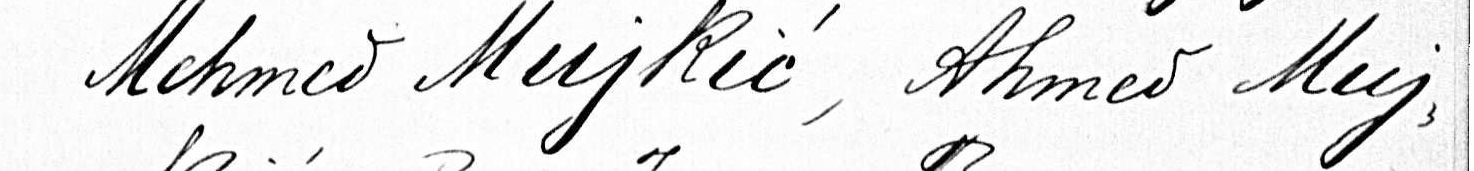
Mehmed Mujkić, Ahmed Muj¬
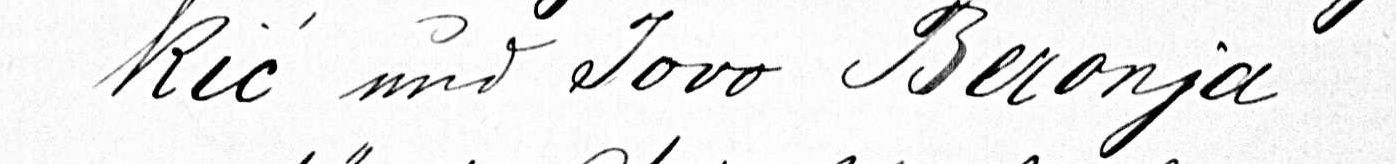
kić und Jovo Beronja
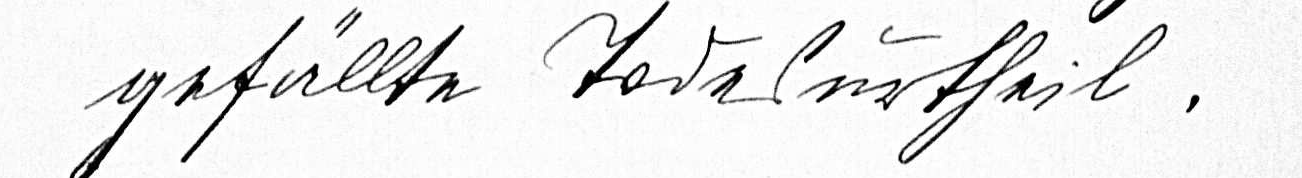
gefällte Todesurtheil.
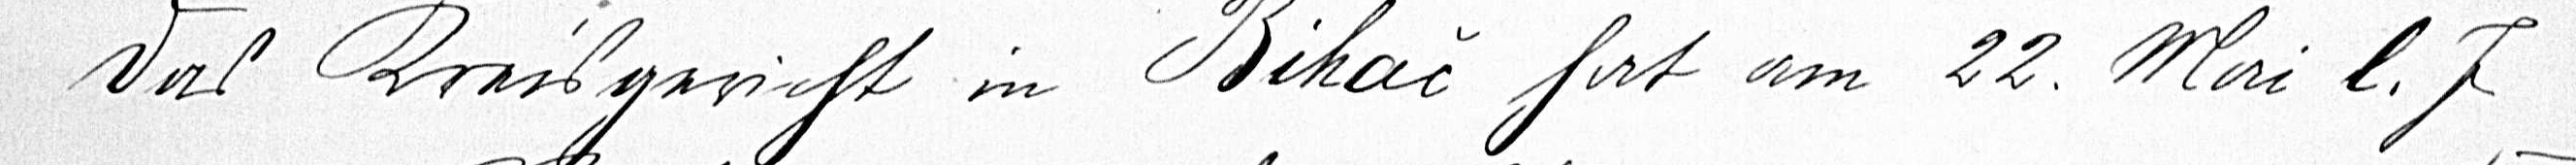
Das Kreisgericht in Bihac hat am 22. Mai l.J.
